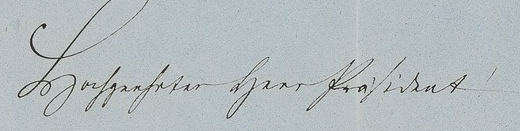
Hochgeehrter Herr Präsident!
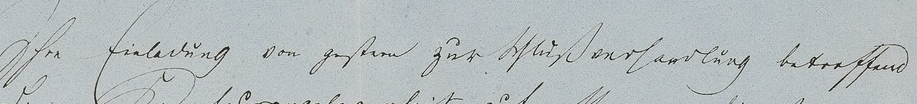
Ihre Einladung von gestern zur Schlußverhandlung betreffend
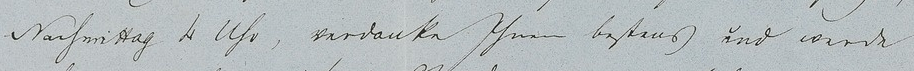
Nachmittag 4 Uhr, verdanke Ihnen bestens und werde
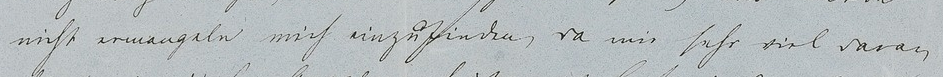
nicht ermangeln mich einzufinden, da mir sehr viel daran
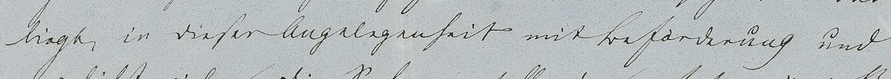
liegt, in dieser Angelegenheit mit Beförderung und
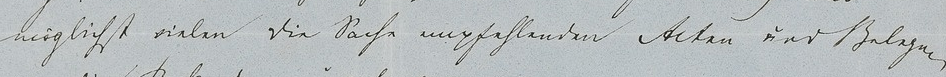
möglichst vielen die Sache empfehlenden Acten und Belegen
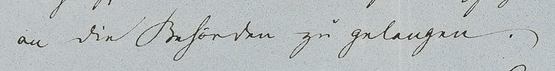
an die Behörden zu gelangen.
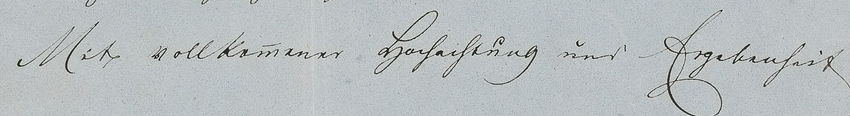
Mit vollkommener Hochachtung und Ergebenheit
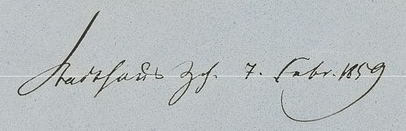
Stadthaus Zch.7. Febr. 1859
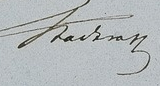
Stadtrath
